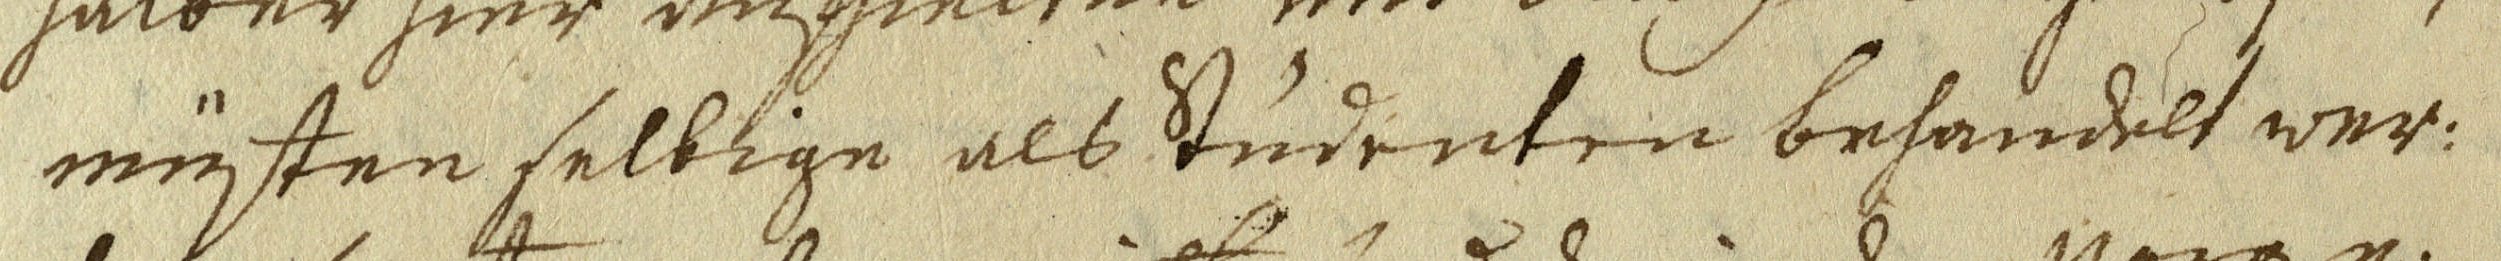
müßten selbige als Studenten behandelt wer¬
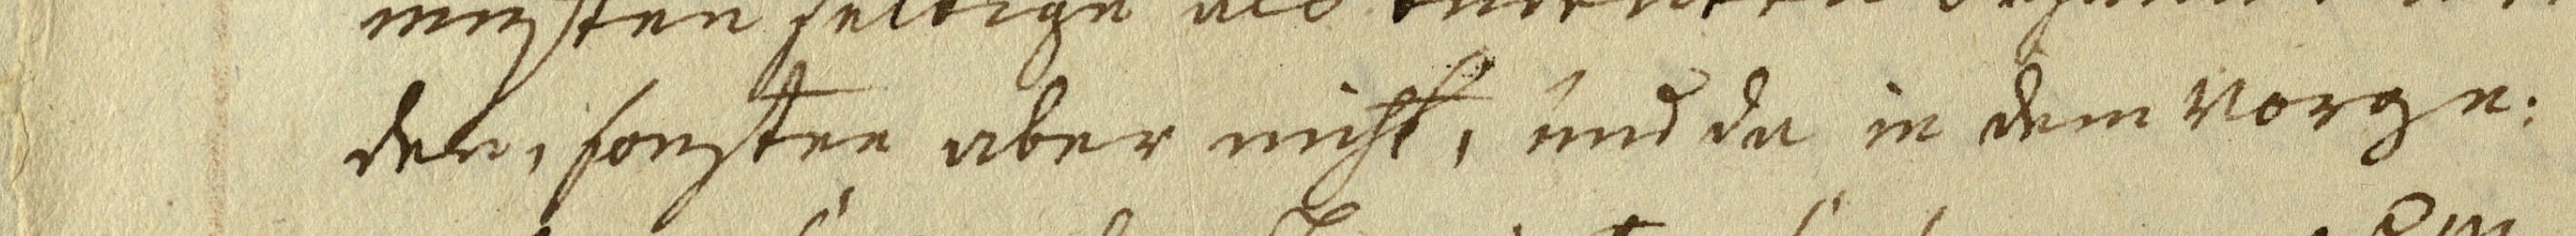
den, sonsten aber nicht, und da in dem vorge¬
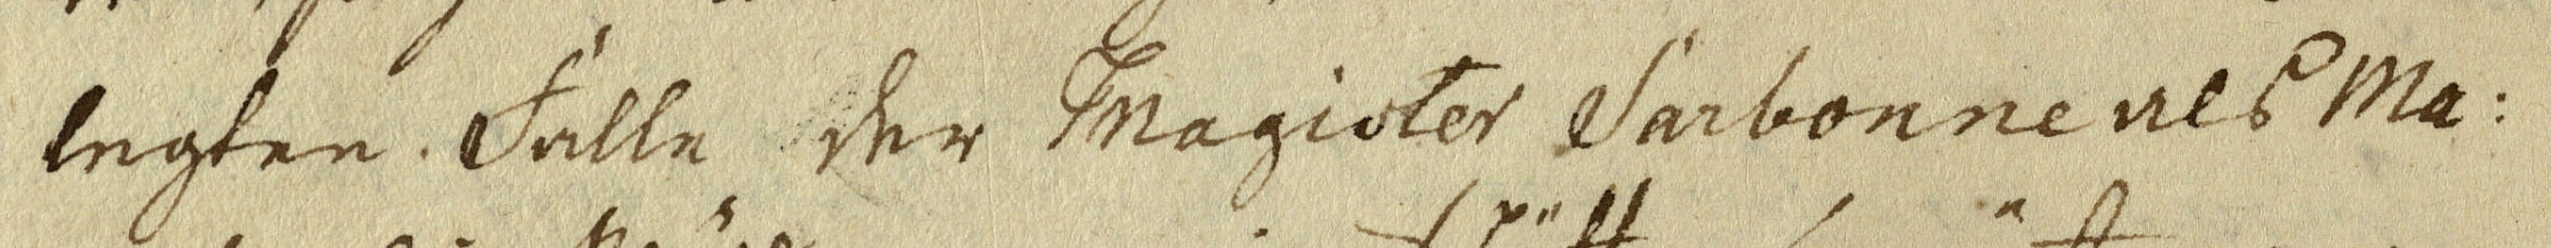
legten Falle der Magister Sarbonne als Ma¬
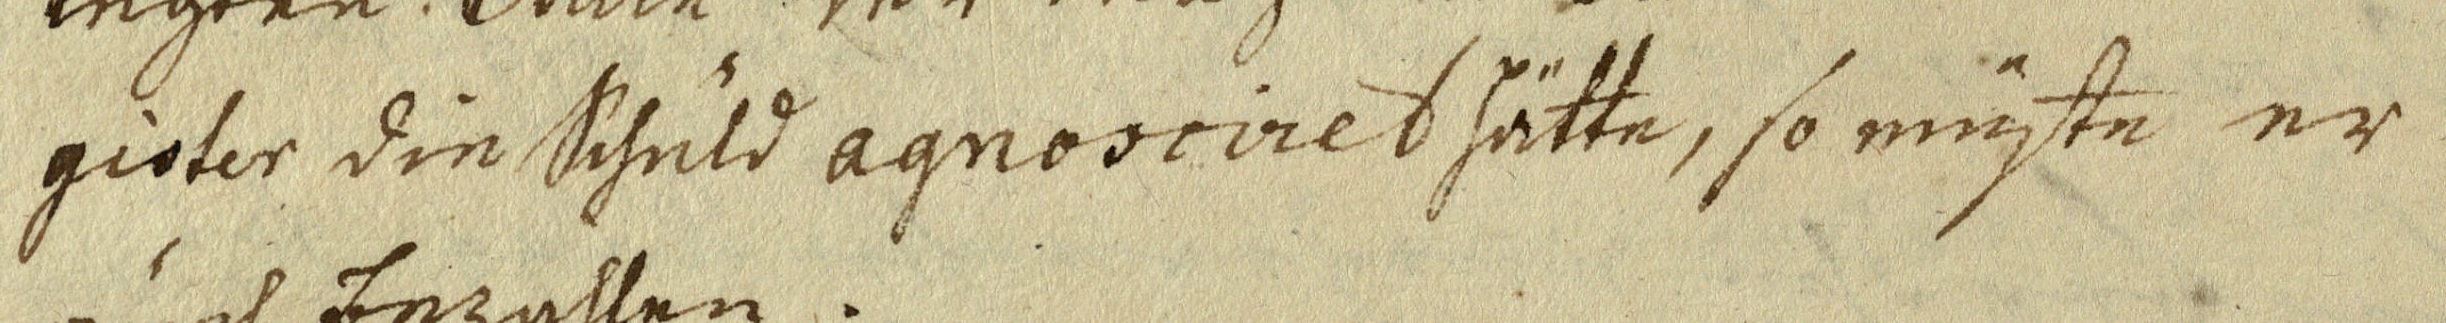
gister die Schuld agnosciret hätte, so müßte er
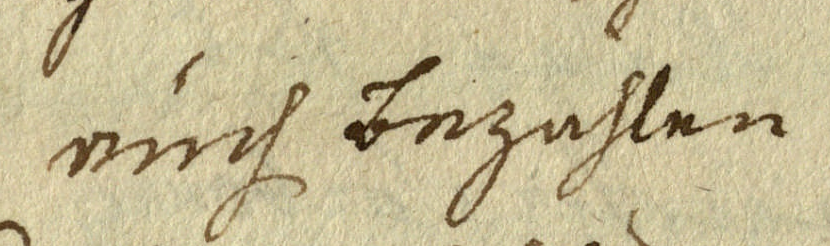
auch bezahlen.
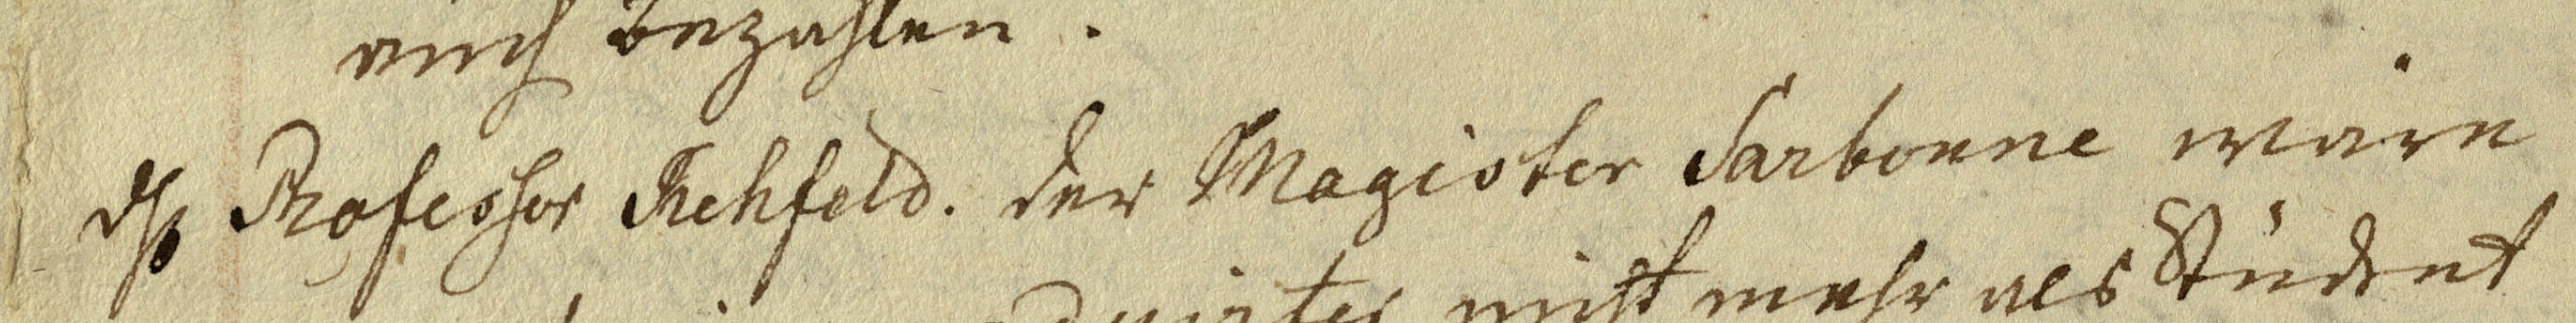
dh Professor Rehfeld. der Magister Sarbonne wäre
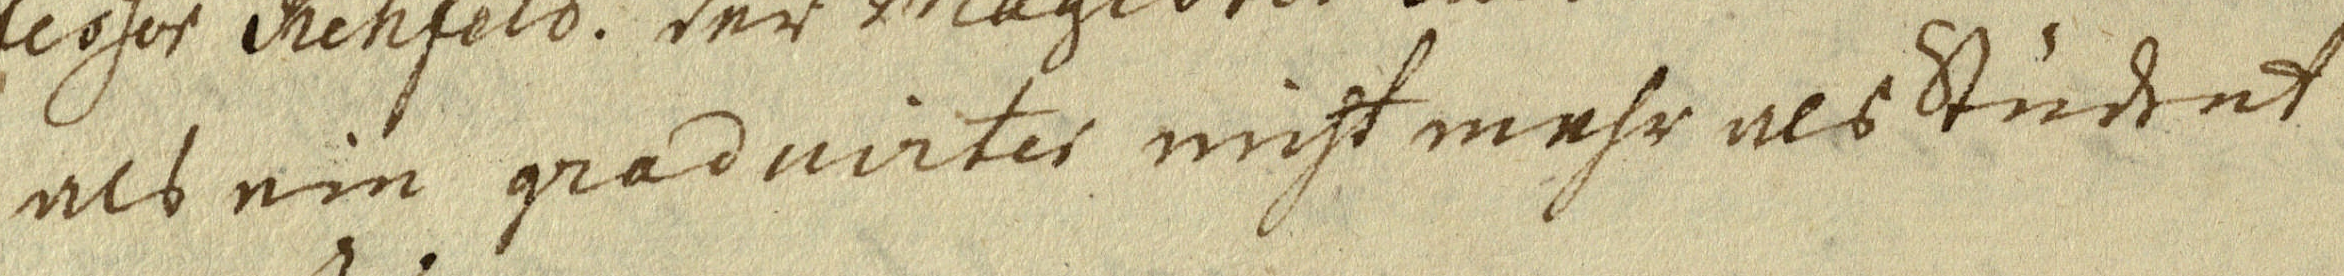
als ein graduirter nicht mehr als Student
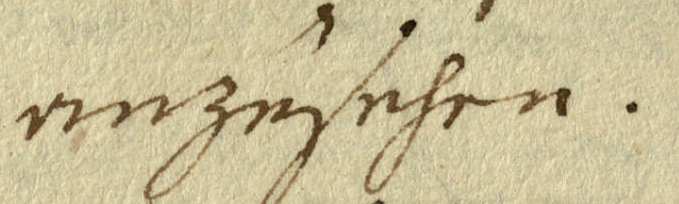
anzusehen.
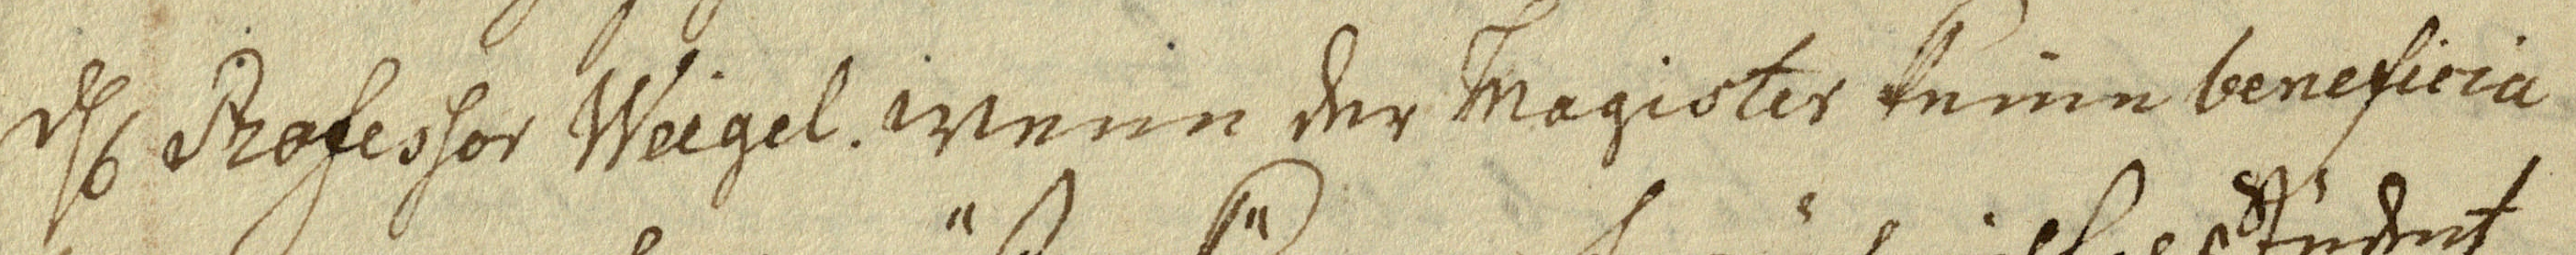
dh Professor Weigel. wenn der Magister keine beneficia
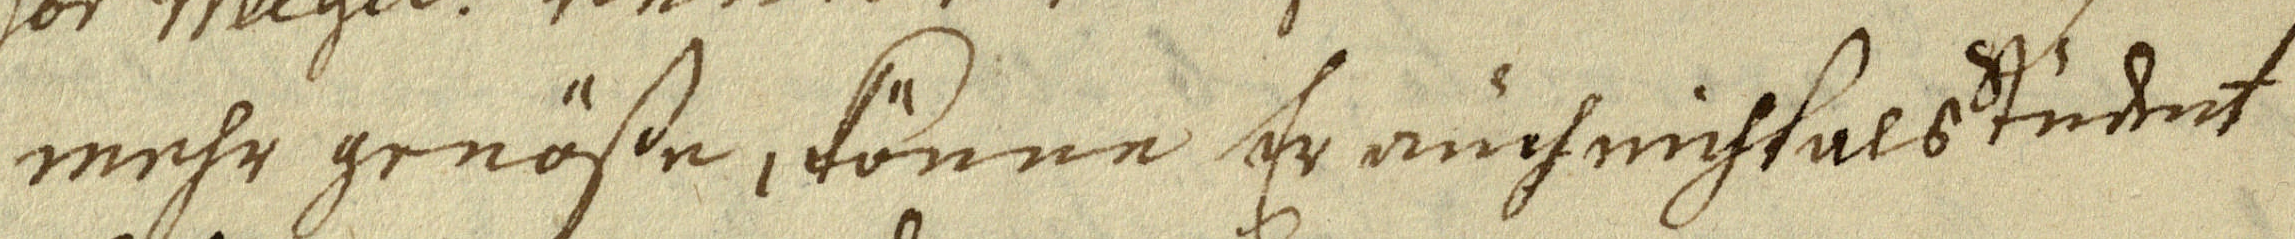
mehr genöße, könne Er auch nicht als Student
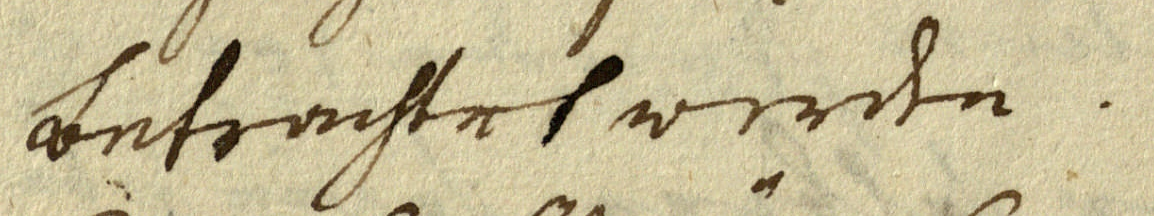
betrachtet werden.
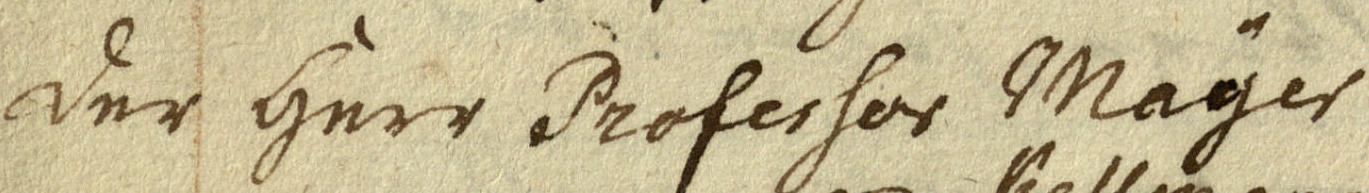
der Herr Professor Maÿer
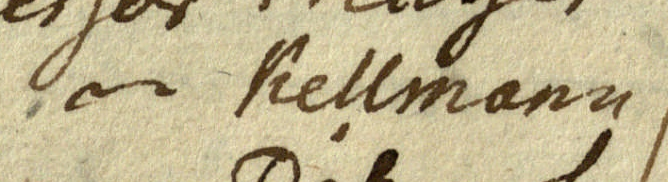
Kellmann
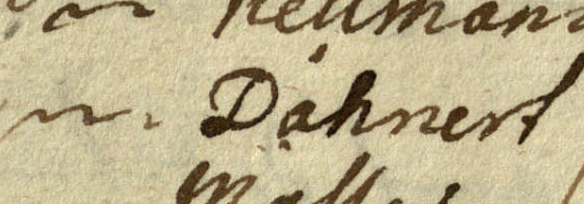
Dähnert
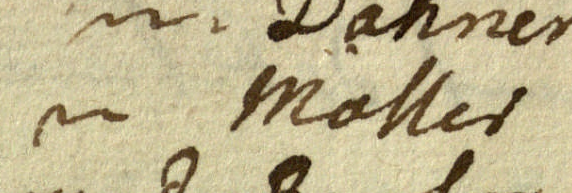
Möller
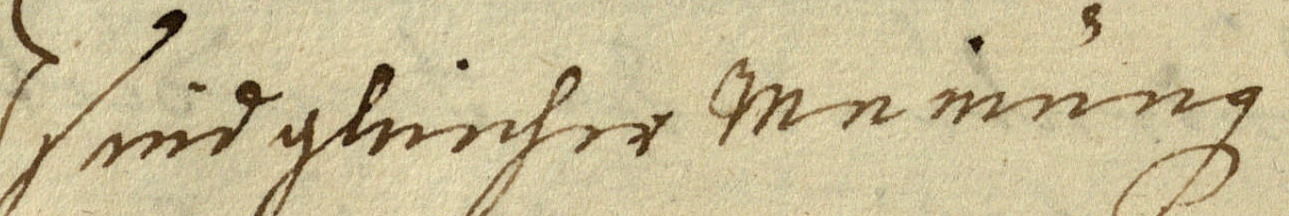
sind gleicher Meinung
